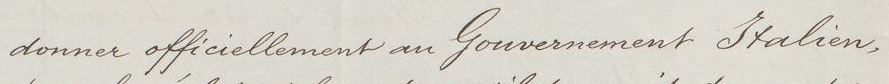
donner officellement au Gouvernement Italien,
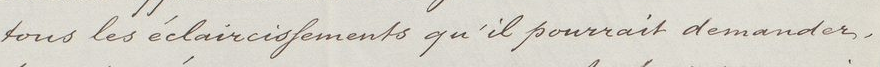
tous les éclarcissements qu'il pourrait demander,
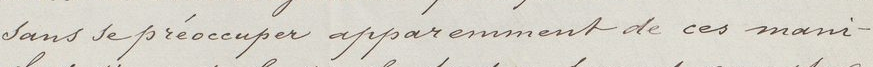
sans se préoccuper apparemment de ces mani-
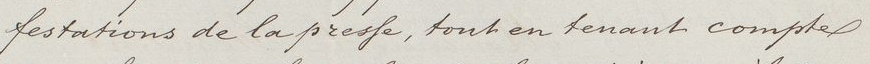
festations de la presse, tout en tenant compte
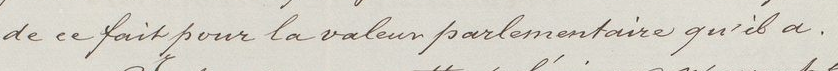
de ce fait pour la valeur parlementaire qu'il a.
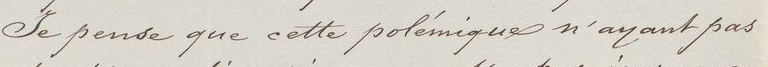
Je pense que cette polémique n'ayant pas
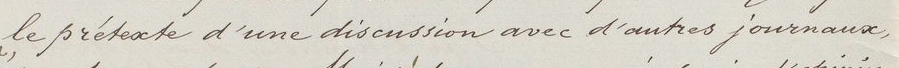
le prétexte d'une discussion avec d'autres journaux,
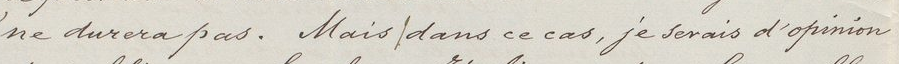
ne durera pas. Mais si elle continuait, dans ce cas, je serais d'opinion
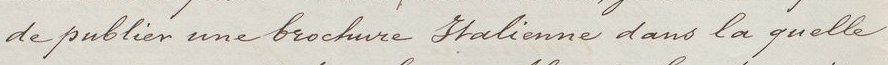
de publier une brochure Italienne dans la quelle
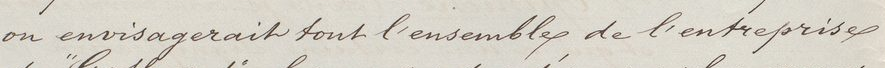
on envisagerait tout l'ensemble de l'entreprise
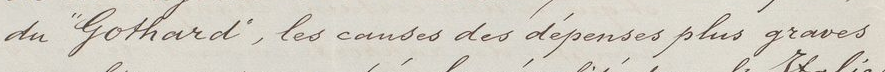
du «Gothard», les causes des dépenses plus graves
